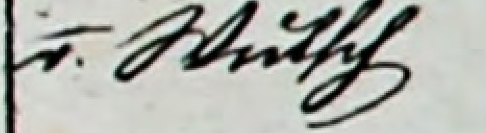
v. Wutsch
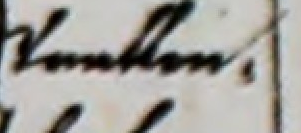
Tratten„
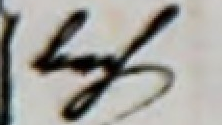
bach
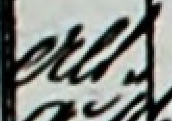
Alt„
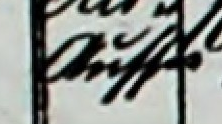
aussee
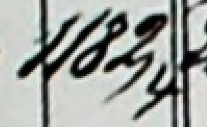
1182/4
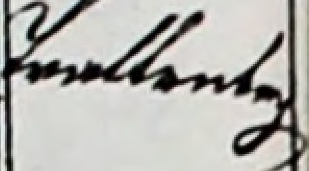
Trattenbach
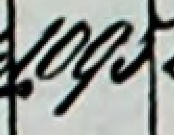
1095
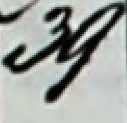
39
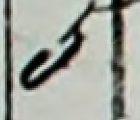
5
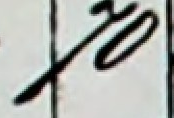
70
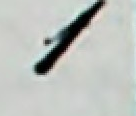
1
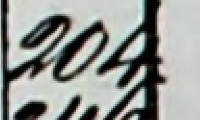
204
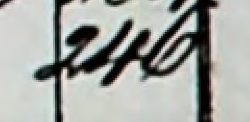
246
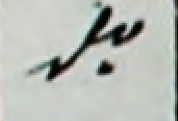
Do
